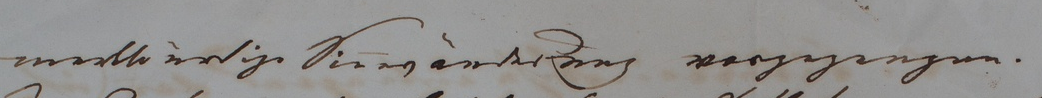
merkwürdige Sinnesänderung vorgegangen.
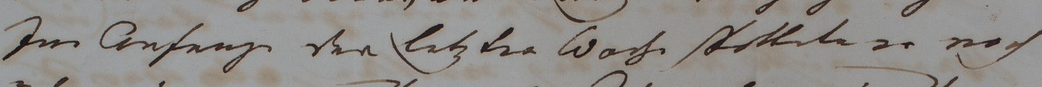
Im Anfange der letzten Woche spottete er noch
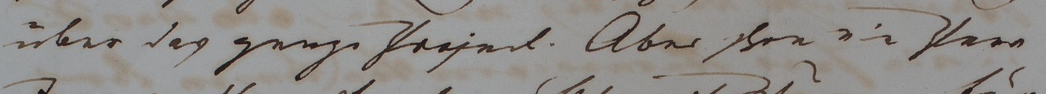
über des ganze Project. Aber schon ein Paar
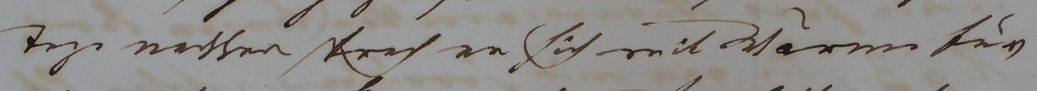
Tage nachher sprach er sich mit Wärme für
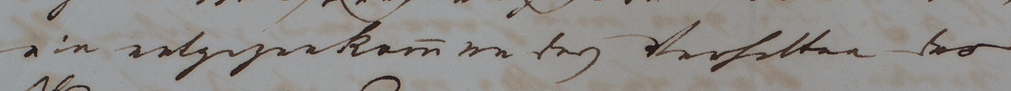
ein entgegenkommendes Verhalten des
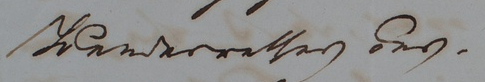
Bundesrathes aus.
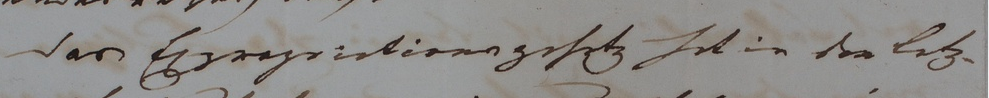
Das Expropriationsgesetz hat in den letz-
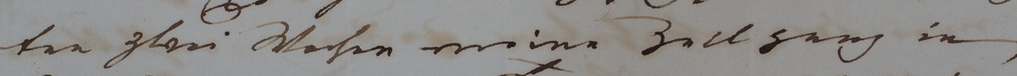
ten zwei Wochen meine Zeit ganz in
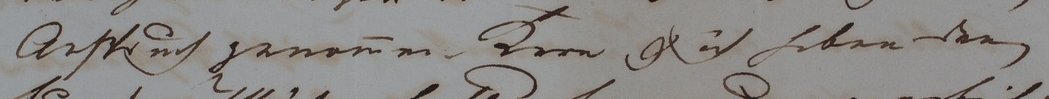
Anspruch genommen. Kern & ich haben den
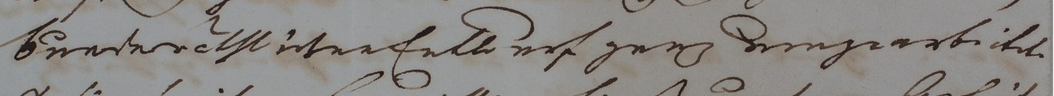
bundesräthlichen Entwurf ganz umgearbeitet
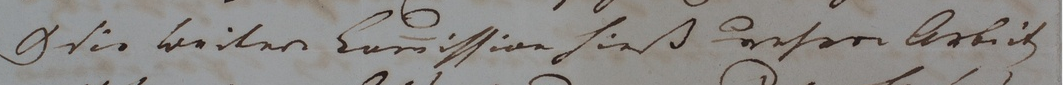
& die weitere Commission hieß unsere Arbeit
